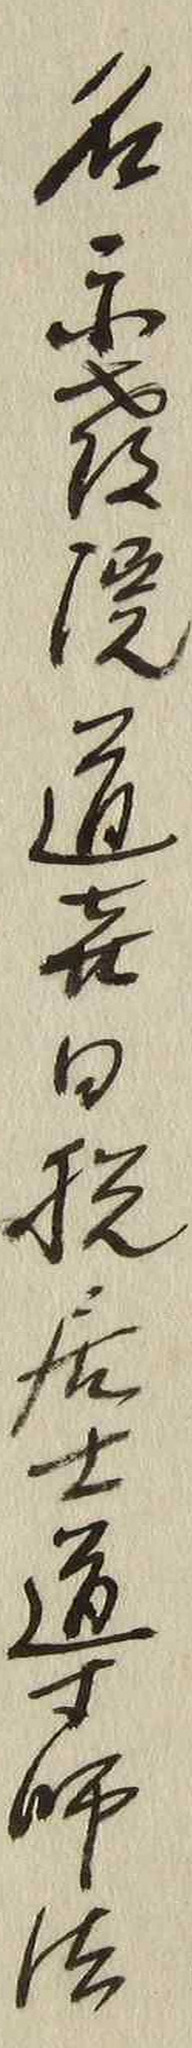名示教院道喜日祝居士導師法
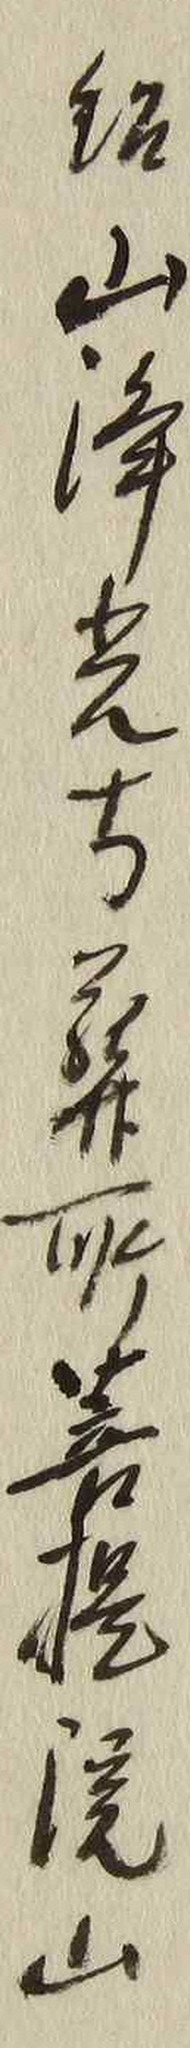紹山浄光寺葬所菩提院山
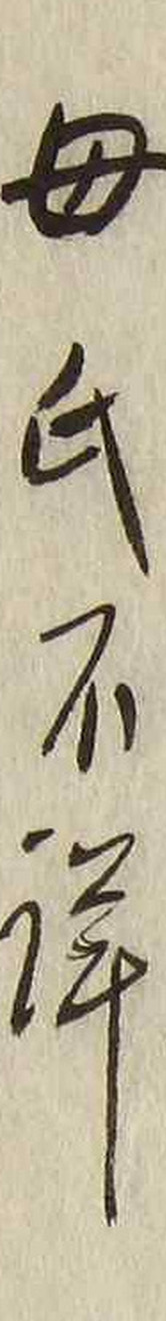母氏不詳
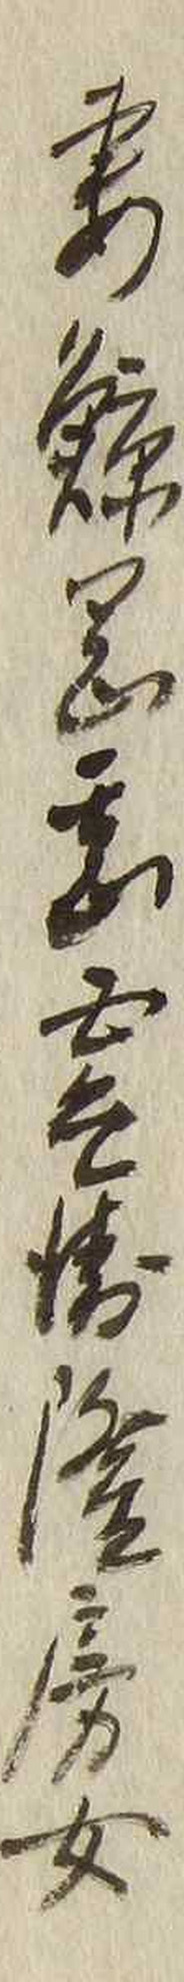妻鯨岡甚五兵衛隆房女

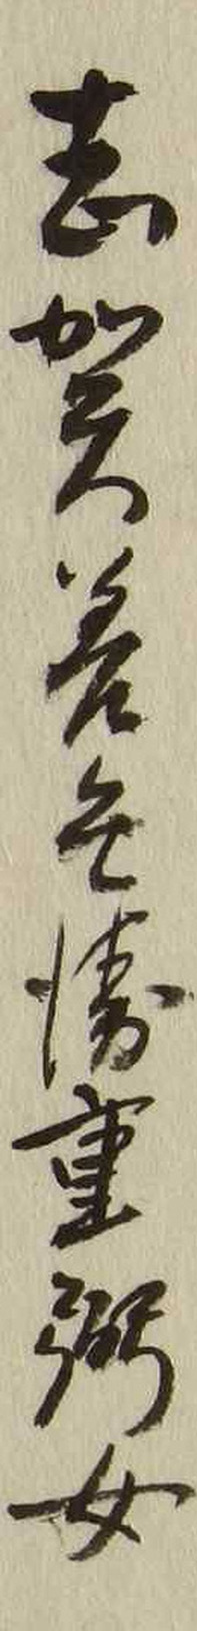志賀善兵衛重弼女
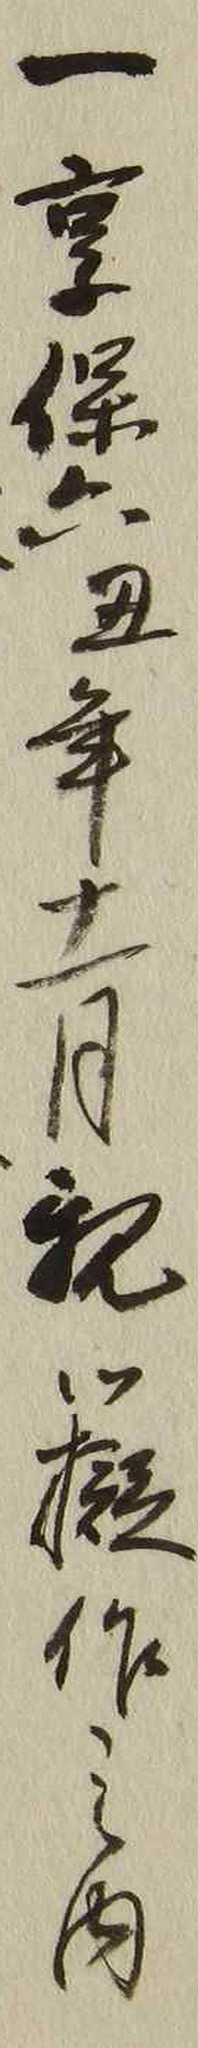一享保六丑年十一月親御擬作之内
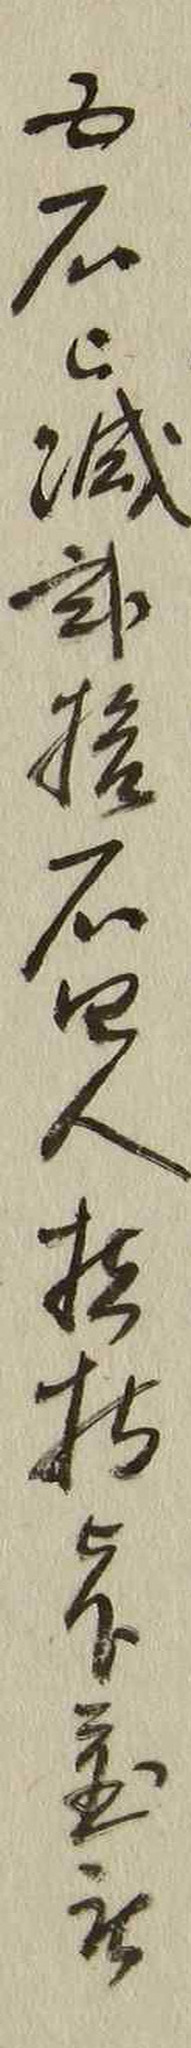五石被減弐拾石四人扶持被下置被
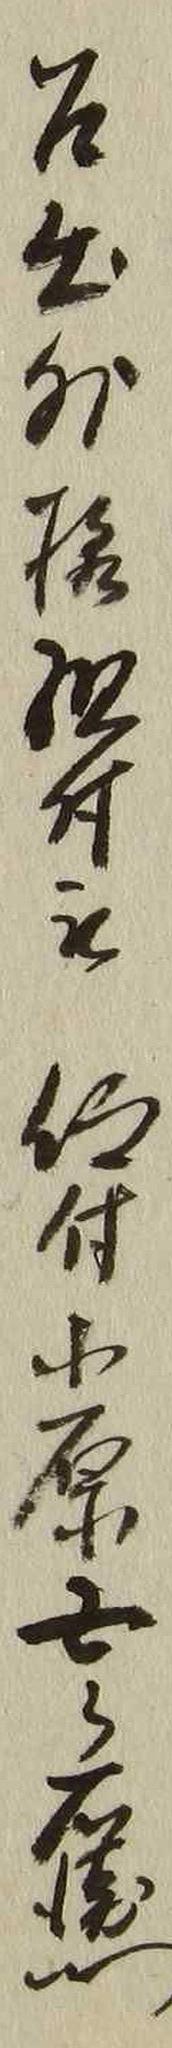召出外様組付被仰付小原五郎右衛門
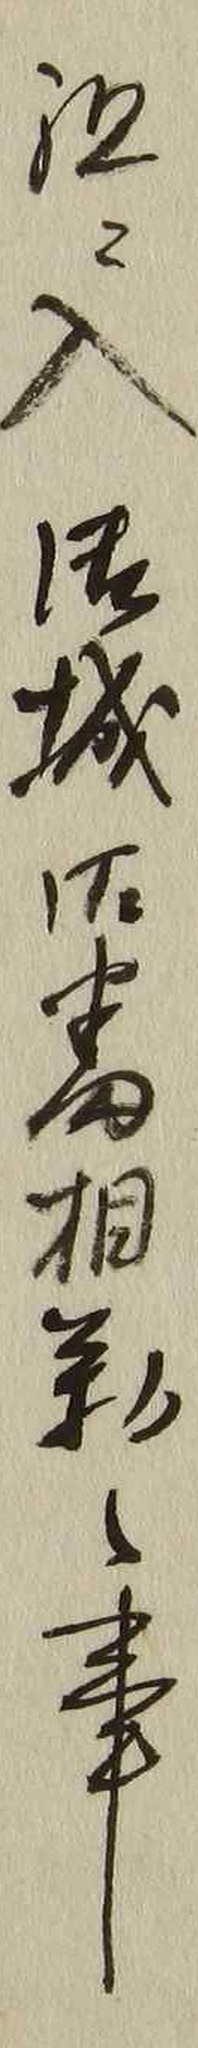組ニ入御城御番相勤候事
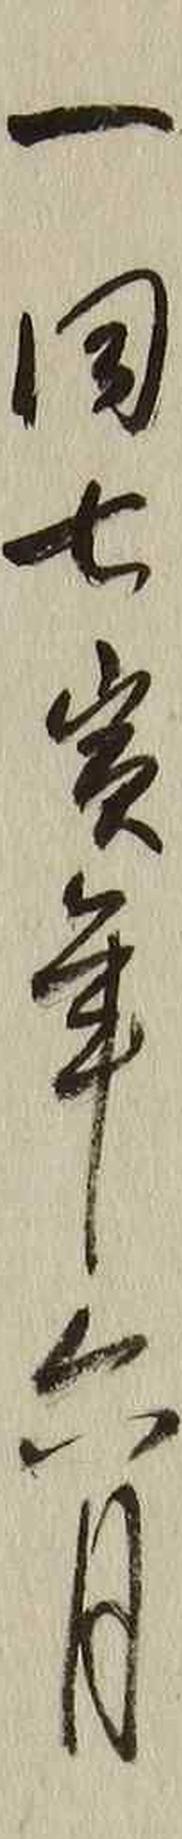一同七寅年六月
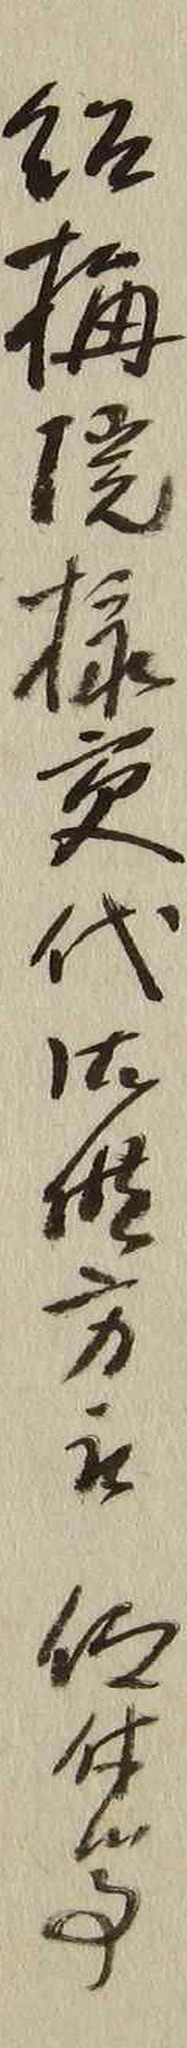紹栴院様交代御供方被仰付候事
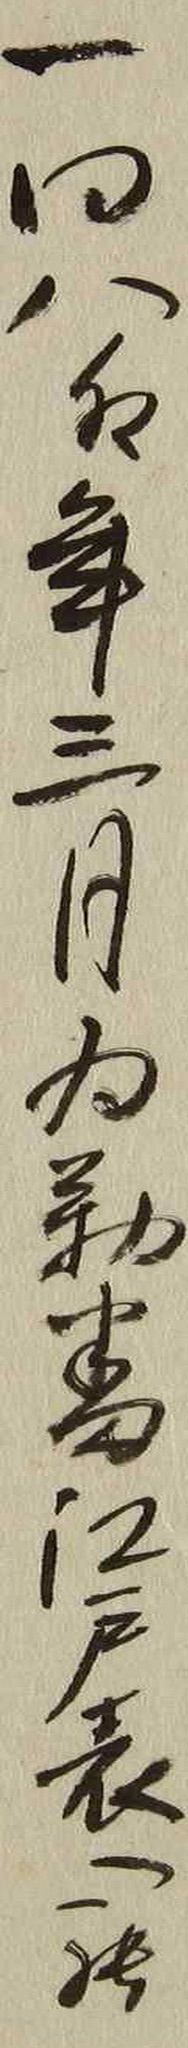一同八卯年三月為勤番江戸表へ罷
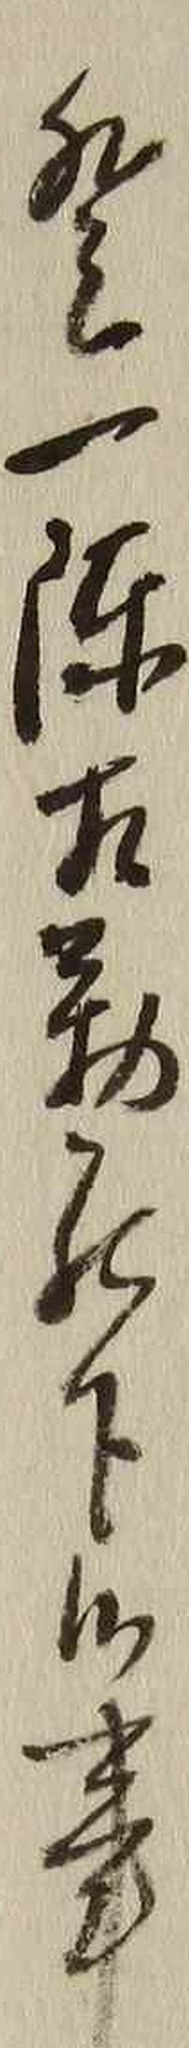登一陣相勤罷下候事
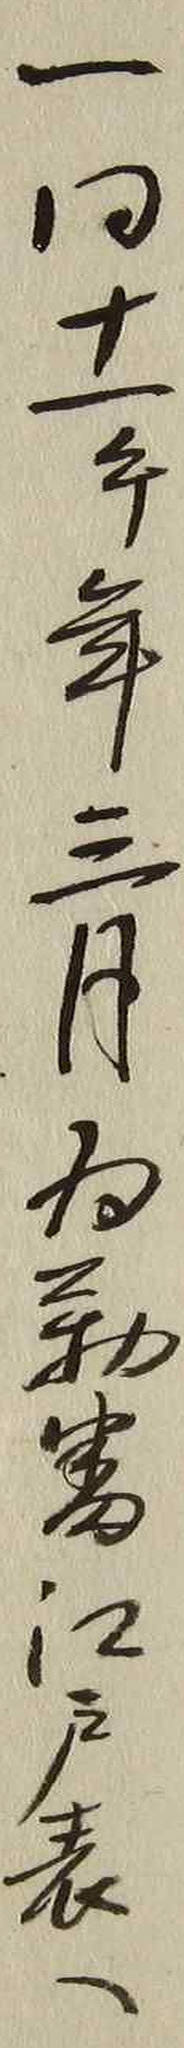一同十一午年三月為勤番江戸表へ
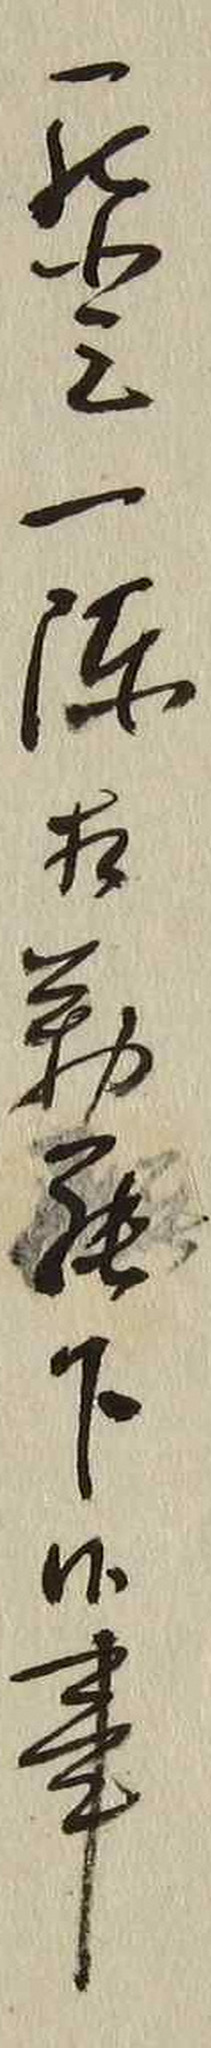罷登一陣相勤罷下候事
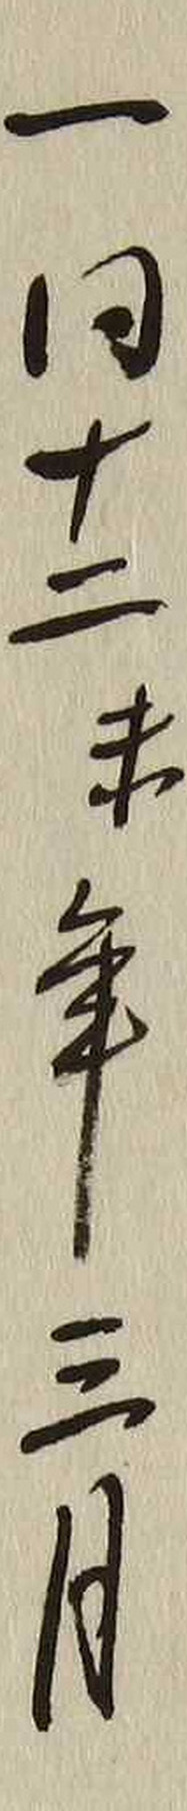一同十二未年三月
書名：諸士系譜　巻之359　す之部9
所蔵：会津若松市立会津図書館
